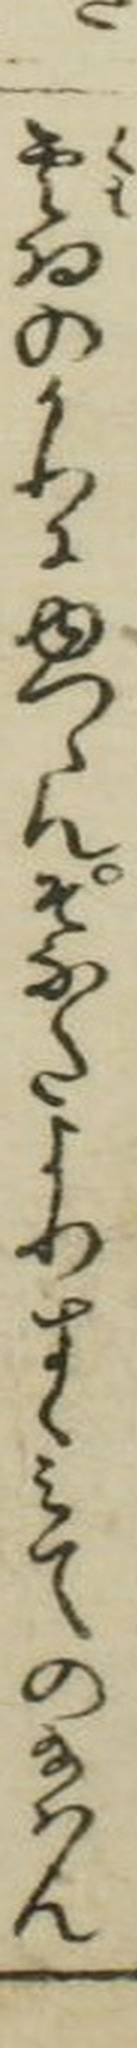雲ゐのかりにゆつらん。そなたよりすゝみての給はん
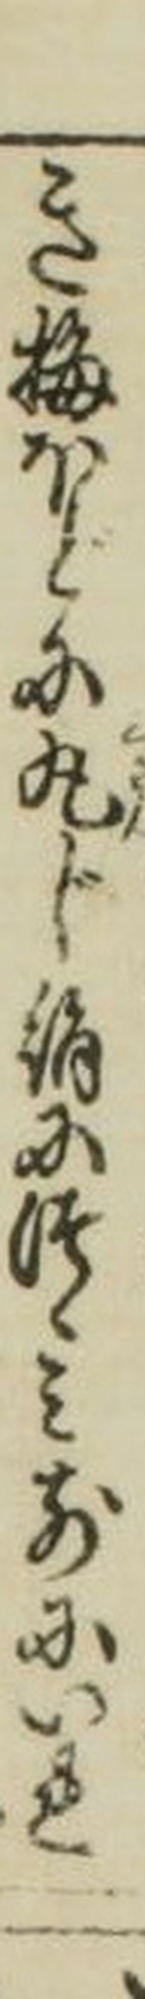き梅ほどに丸じ絹につゝみ前にいれ
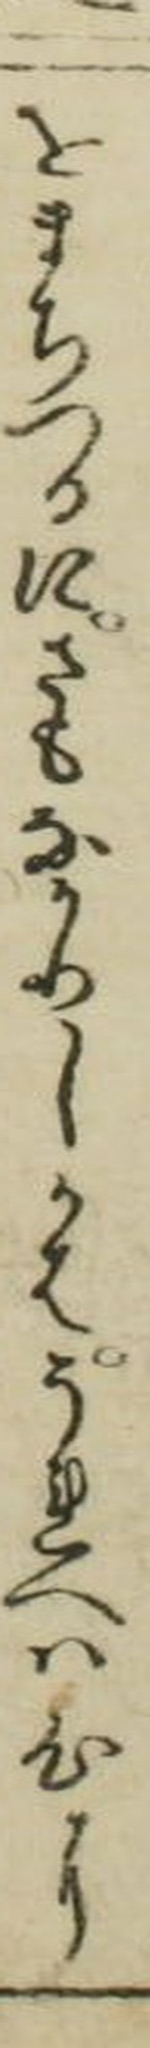をまちつるに。さもなかりしかは。うれへは心に
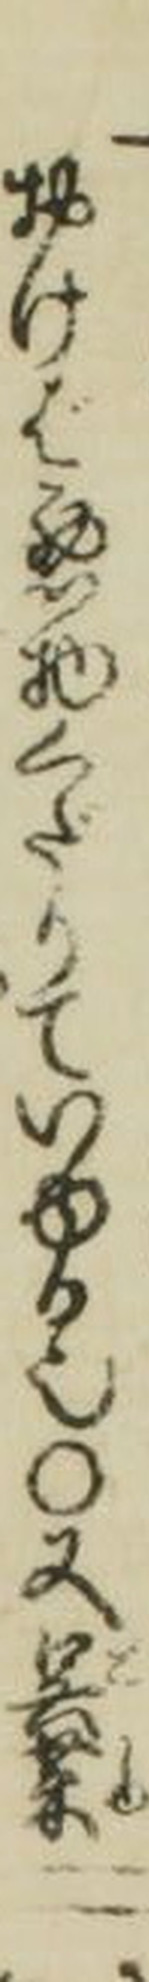おけば悪物くだりていゆる也◯又呉茱
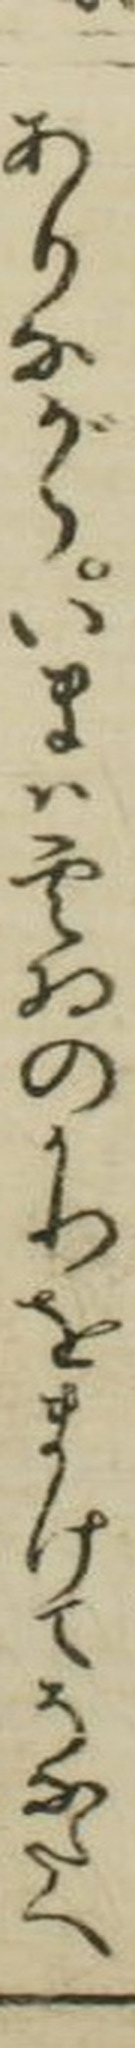ありながら。いまは雲ゐのかりをまけてそなたへ
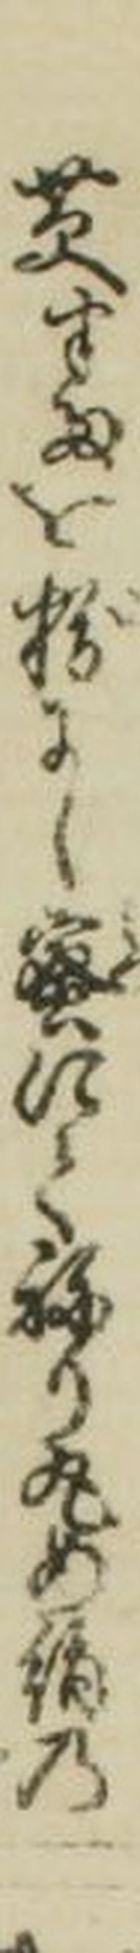萸半両を粉にし蜜にてねり丸め絹の
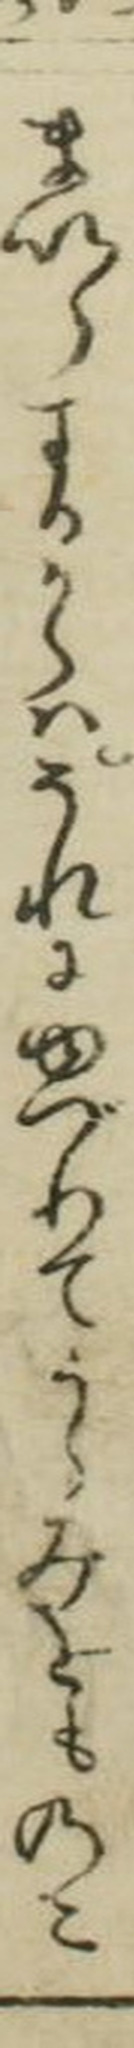まいらするからは。それにゆづりてうらみをものこ
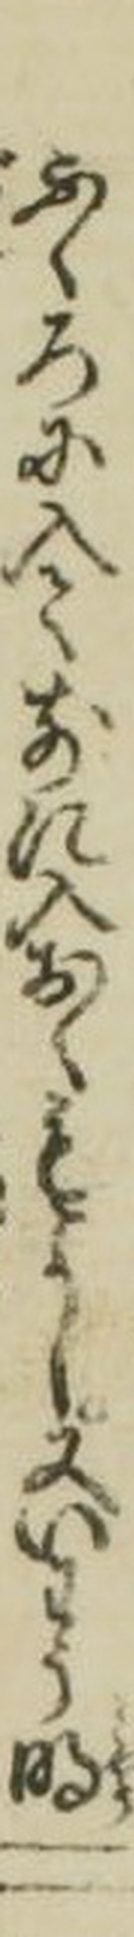ふくろに入て前に入おくもよし。又いわう明
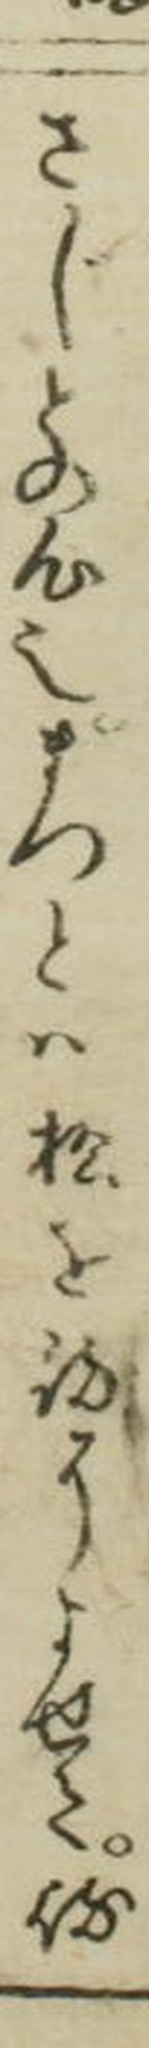さじとの心也。まつとは松を縁によせて。縁
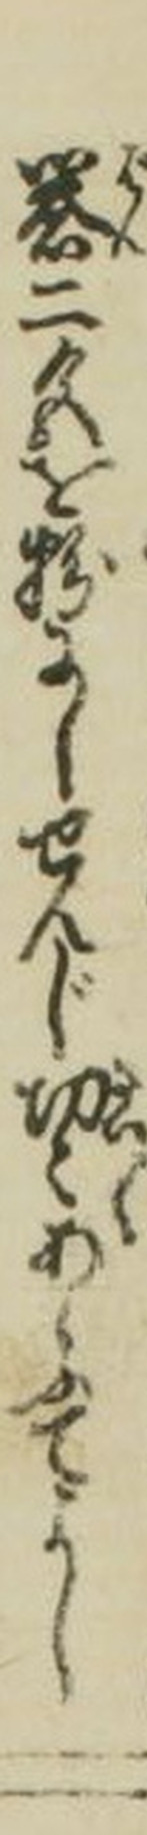礬二色を粉にしせんじ切々あらふてよし
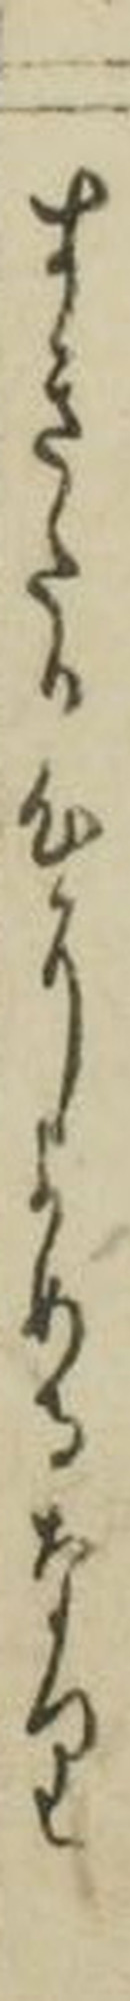すきたる心によめるなり
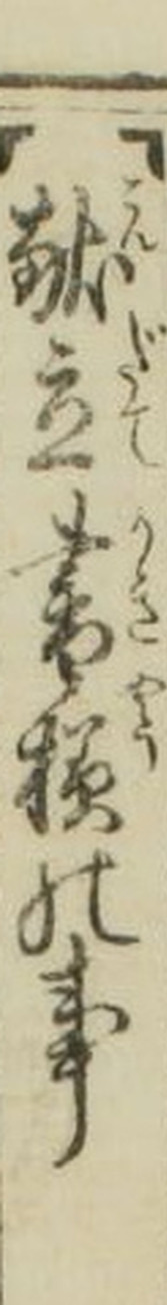「献立書様の事
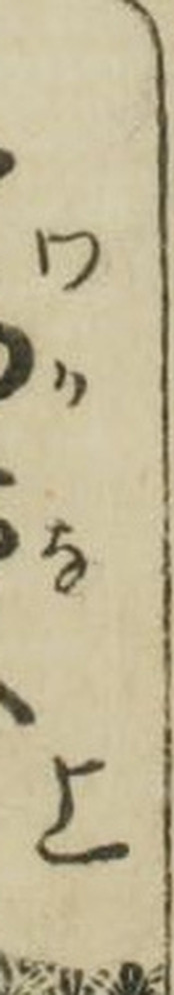わかなも
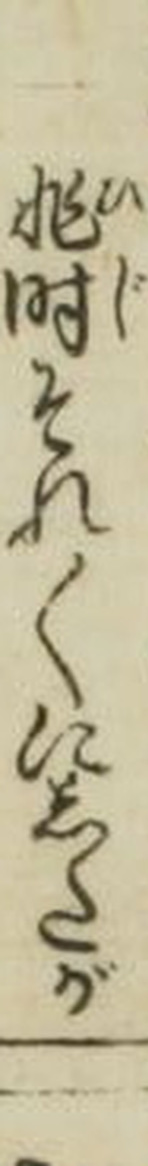非時それ〳〵にしたが
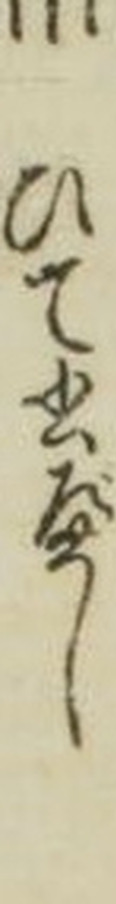ひて書べし
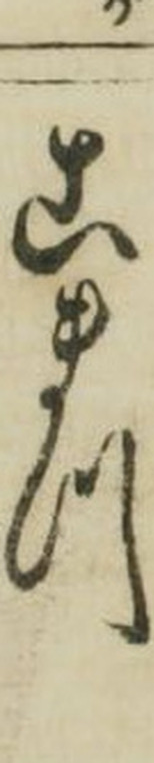こまつ
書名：女源氏教訓鑑
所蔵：東京学芸大学附属図書館
